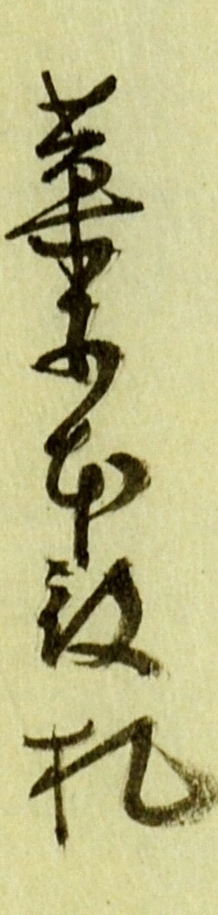菓子本役札
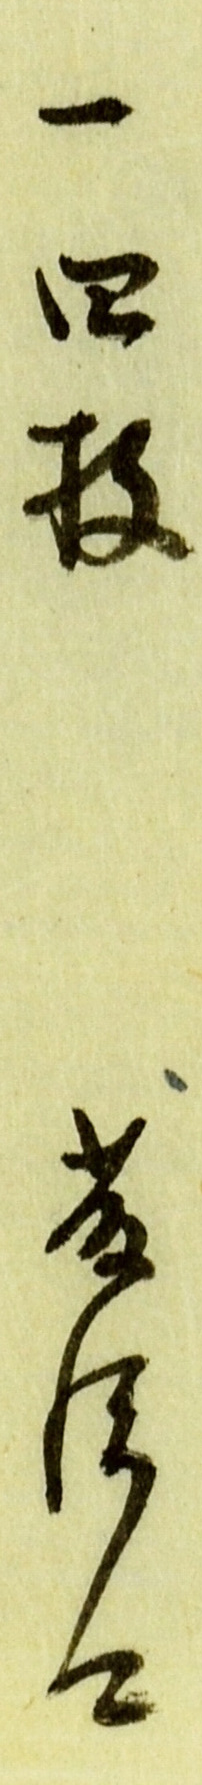一四枚藤沢郷
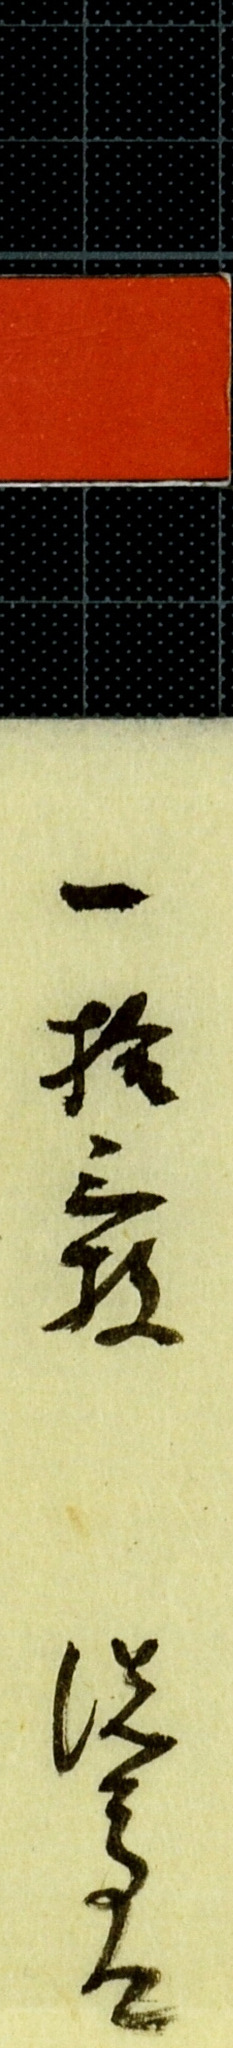一拾三枚洗馬郷
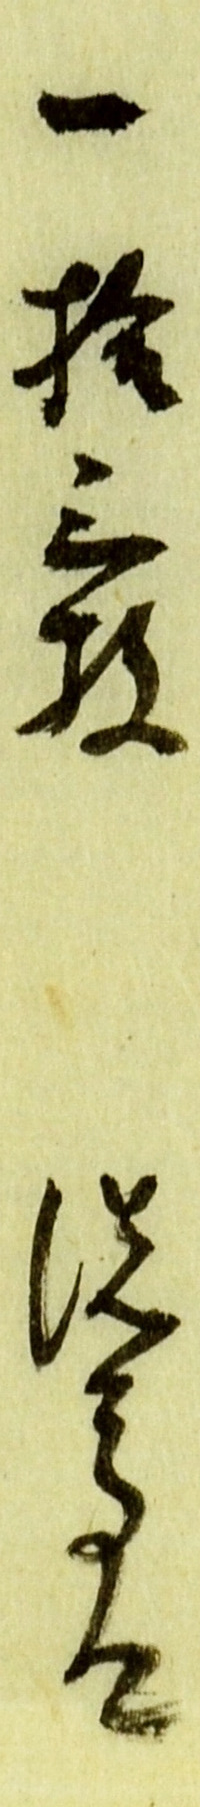一拾三枚洗馬郷
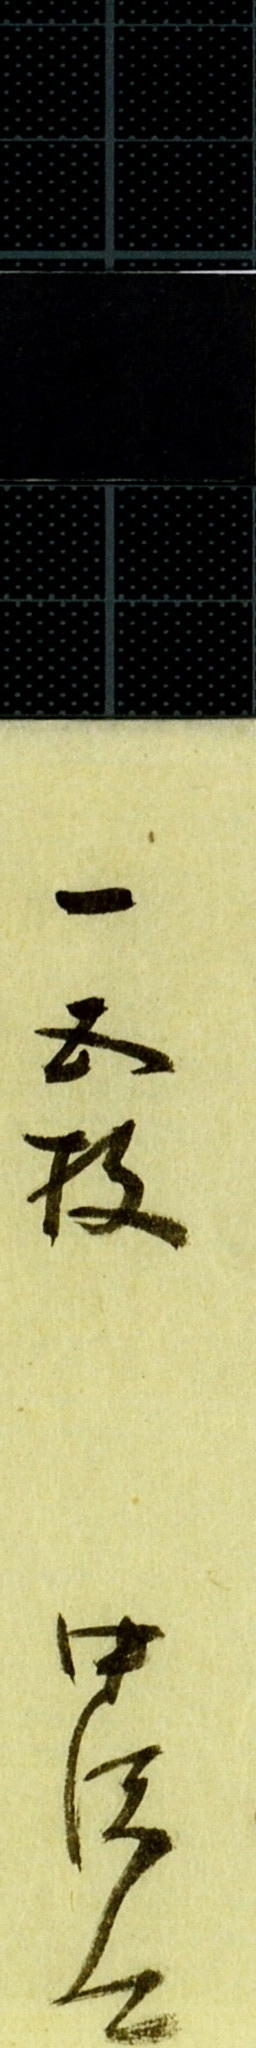一五枚中沢郷
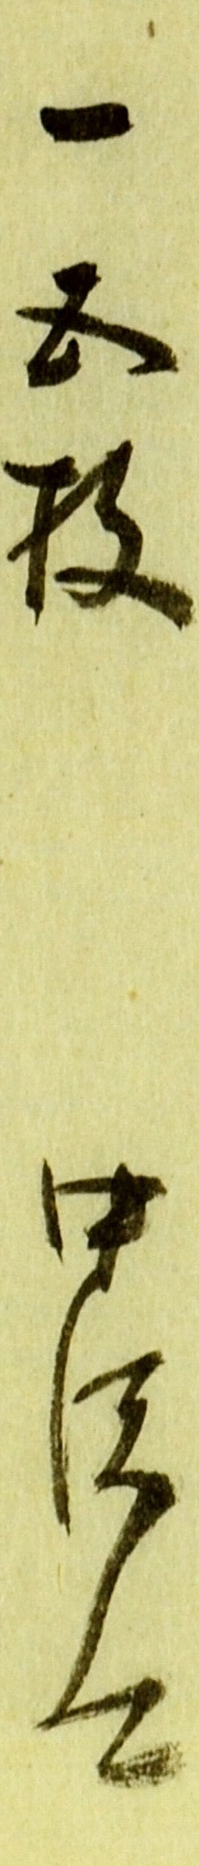一五枚中沢郷
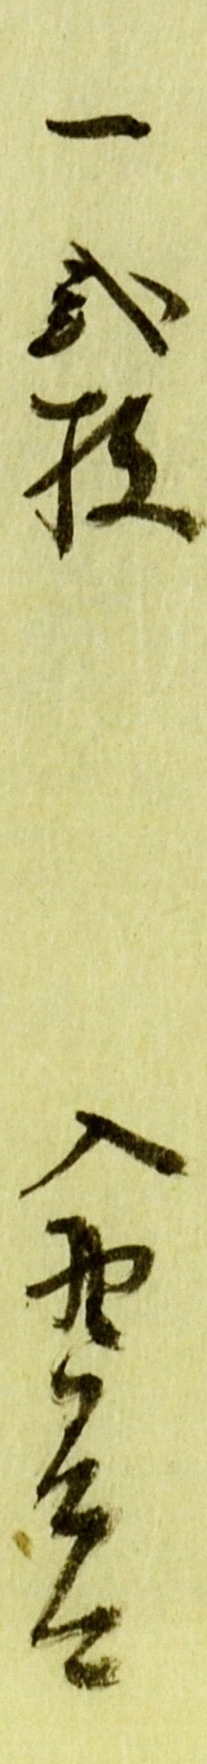一弐枚入野谷郷
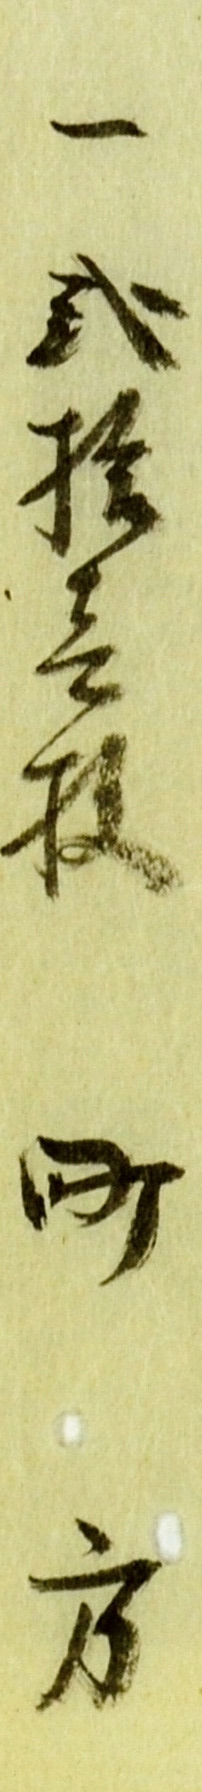一弐拾壱枚町方
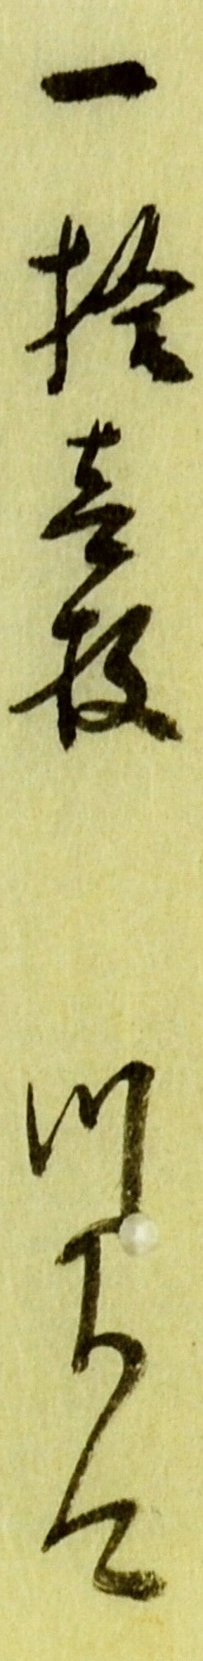一拾壱枚川下郷

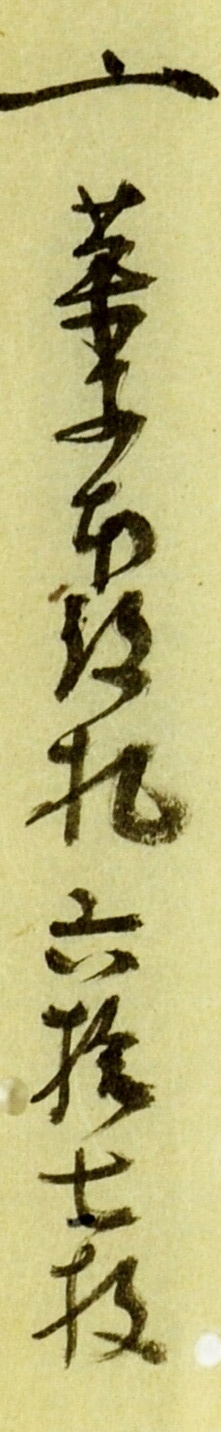〆菓子本役札六拾七枚
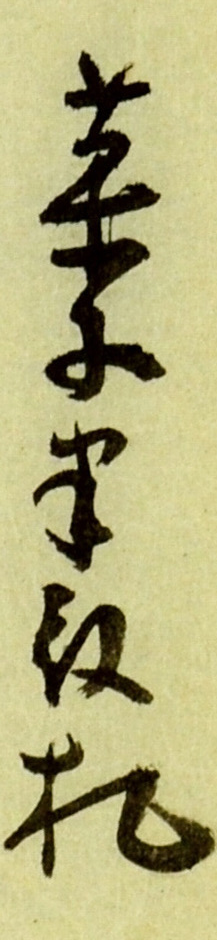菓子半役札
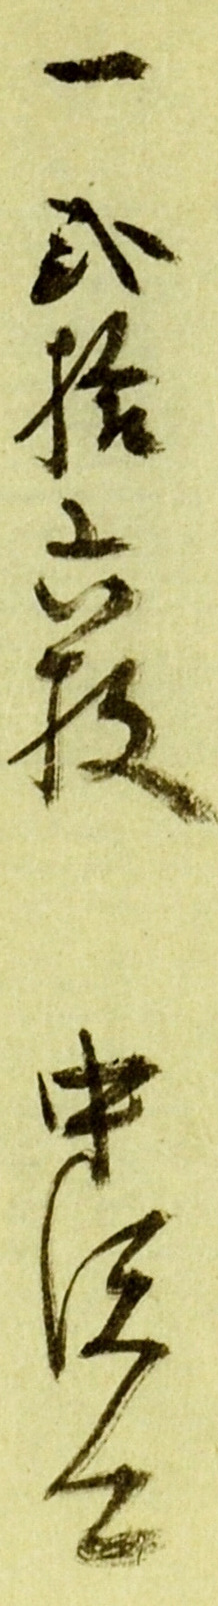一弐拾六枚中沢郷
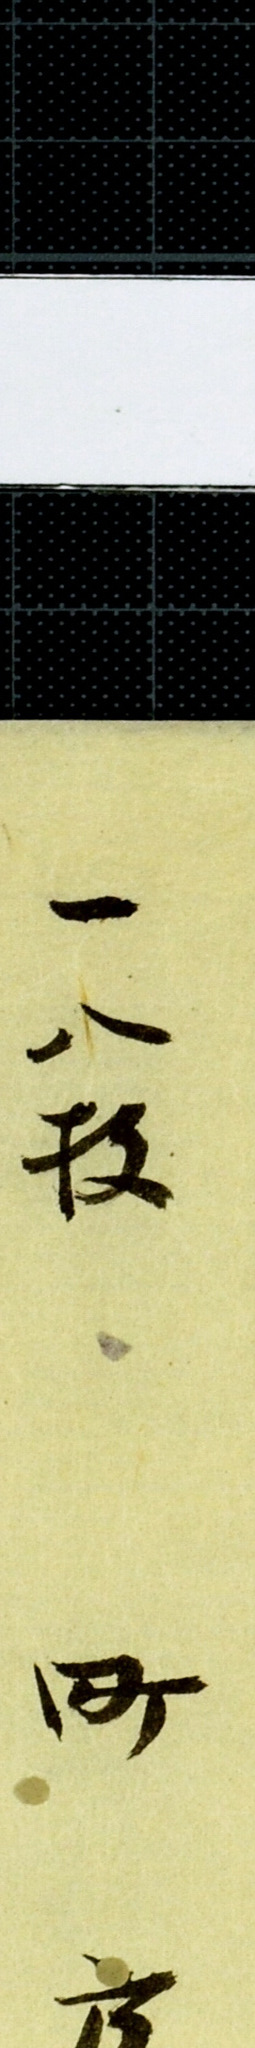一八枚町方
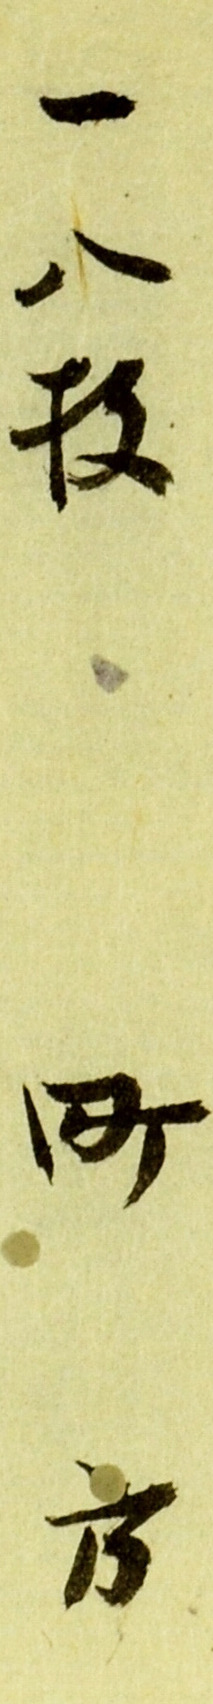一八枚町方
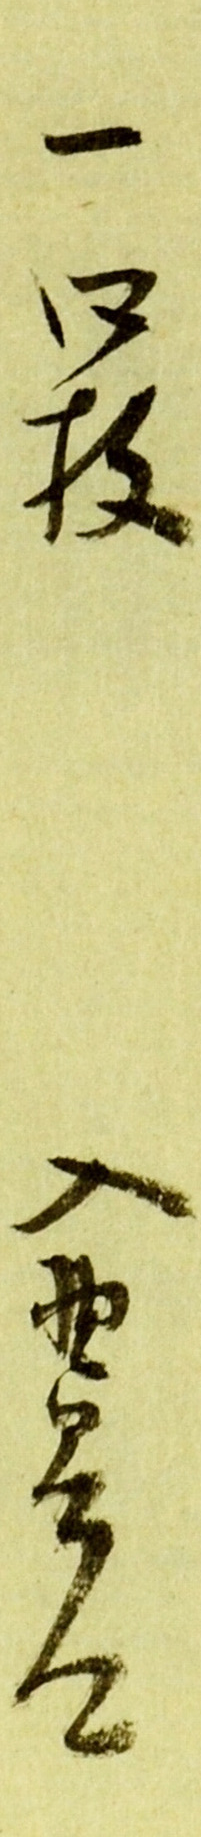一四枚入野谷郷
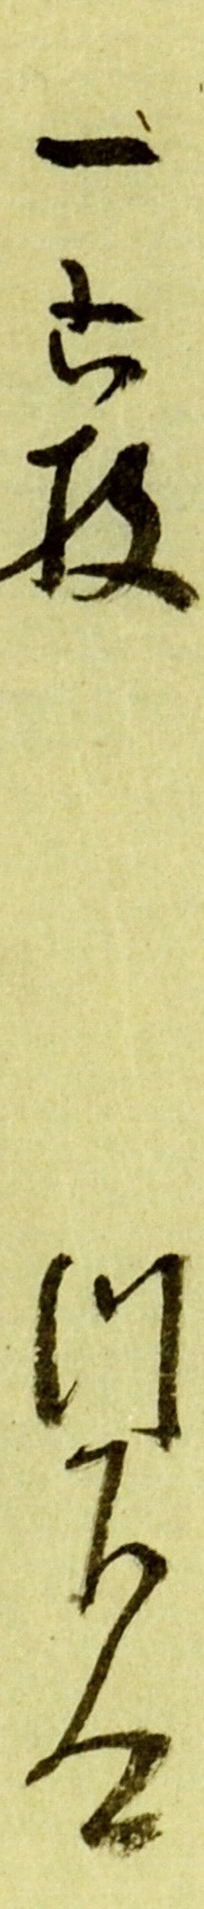一六枚川下郷
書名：午年諸郷并町方鑑札渡覚
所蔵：伊那市立高遠町図書館・合同会社AMANE
